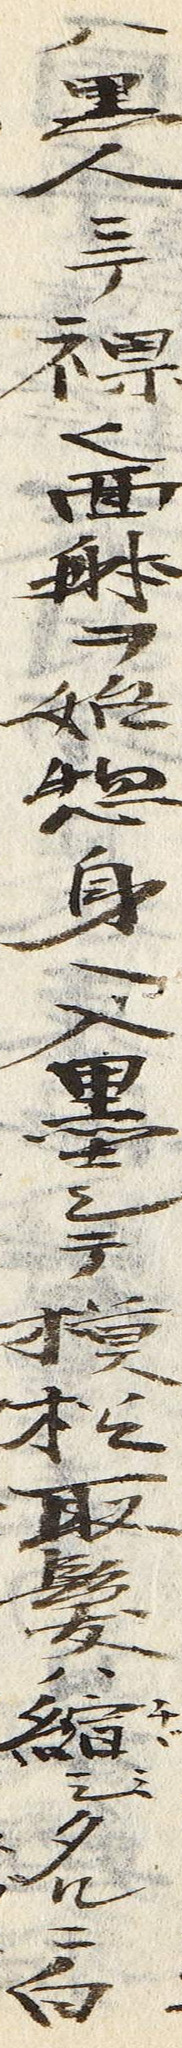ハ黒人ニテ裸也面体ヲ始惣身ヘ入墨シテ模様取髪ハ縮シタルニ白
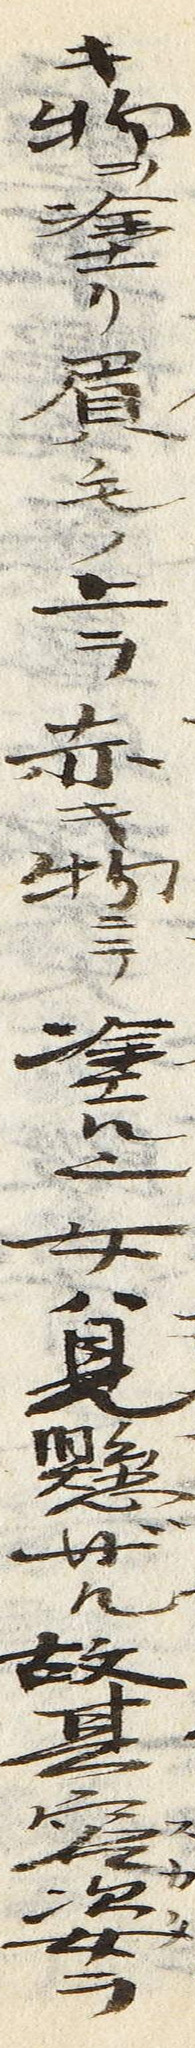キ物ヲ塗リ眉毛ノ上ヲ赤キ物ニテ塗ル也女ハ見懸ザル故其容姿ヲ
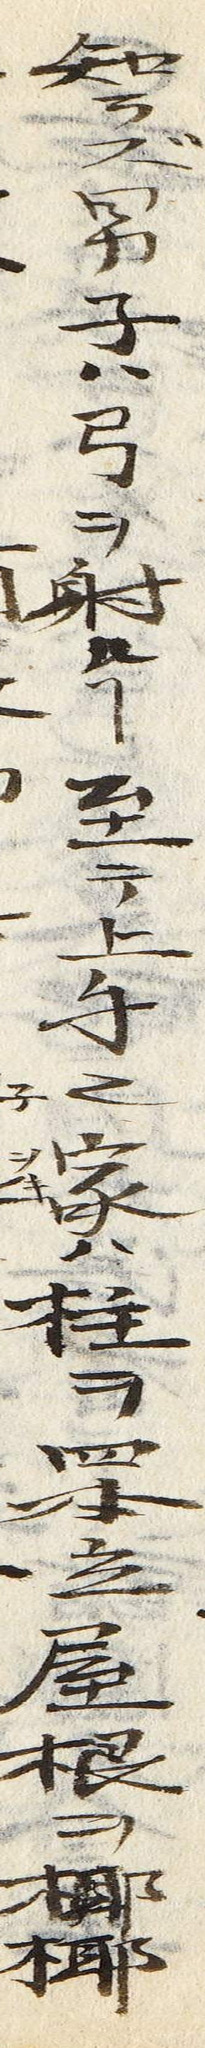知ラズ男子ハ弓ヲ射ルコト至テ上手也家ハ柱ヲ四本立屋根ヲ椰椰
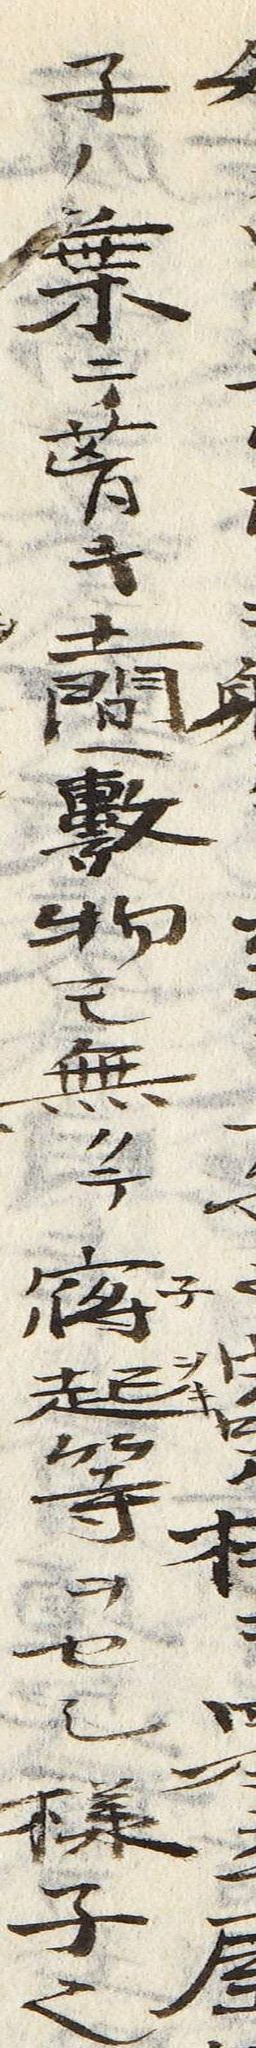子ノ葉ニテ葺キ土間へ敷物モ無クテ寝起等ヲセシ様子也
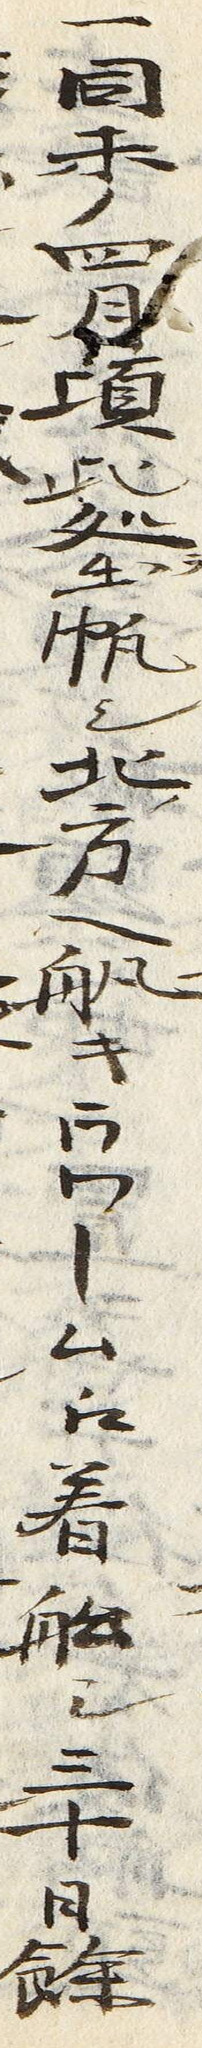一同未ノ四月頃此処ヲ出帆シ北ノ方ヘ航キウワ❘ムえ着船シ三十日余
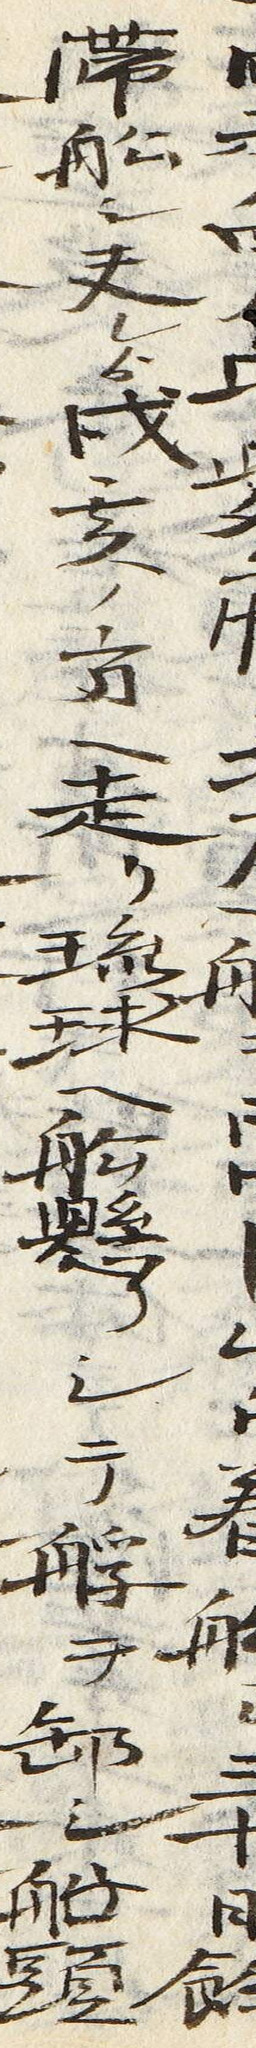滞船シ夫レゟ戌亥ノ方ヘ走リ琉球ヘ船懸リシテ艀ヲ卸シ船頭
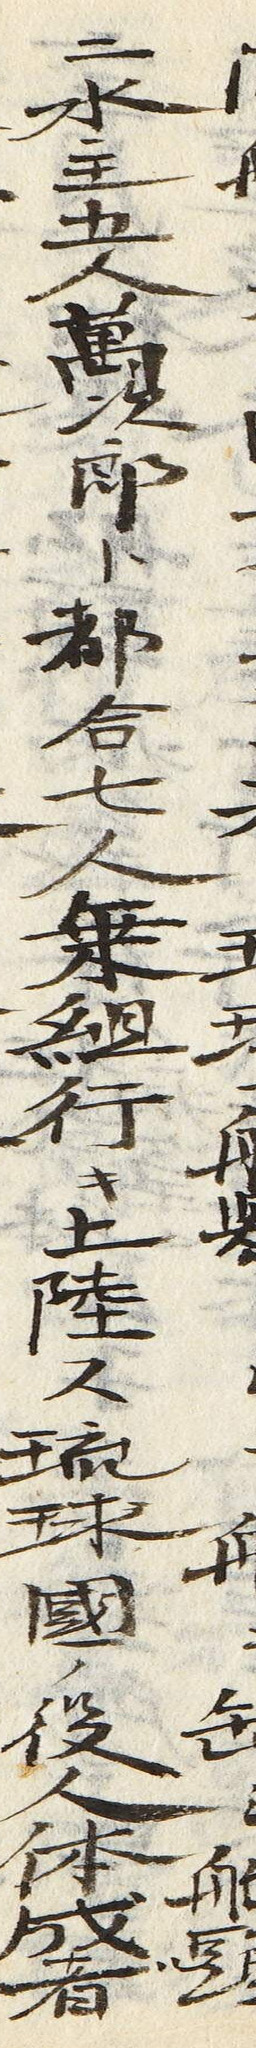ニ水主五人萬次郎ト都合七人乗組行キ上陸ス琉球国ノ役人体成者
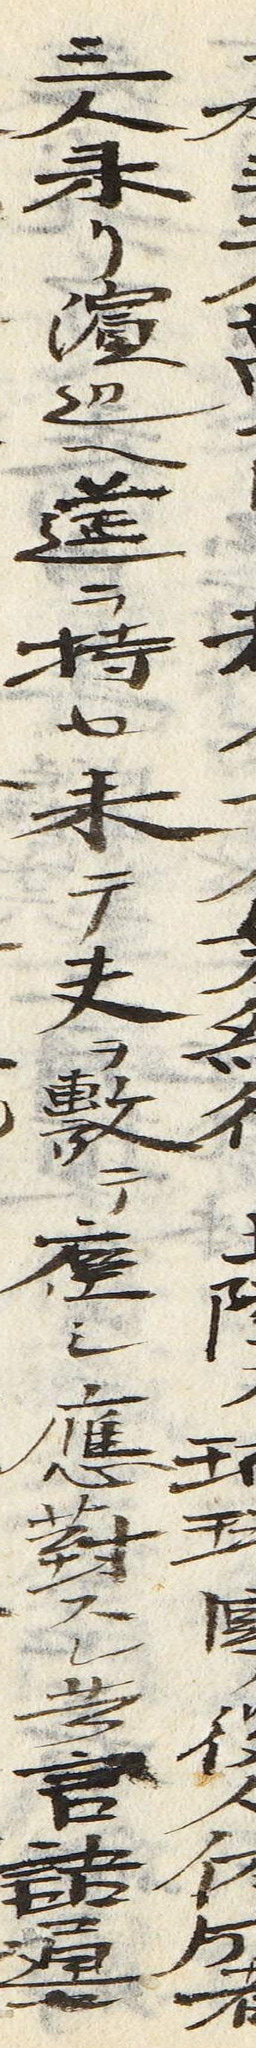三人来リ浜辺ヘ莚ヲ持セ来テ夫ヲ敷テ座シ応対スレ共言語通セ
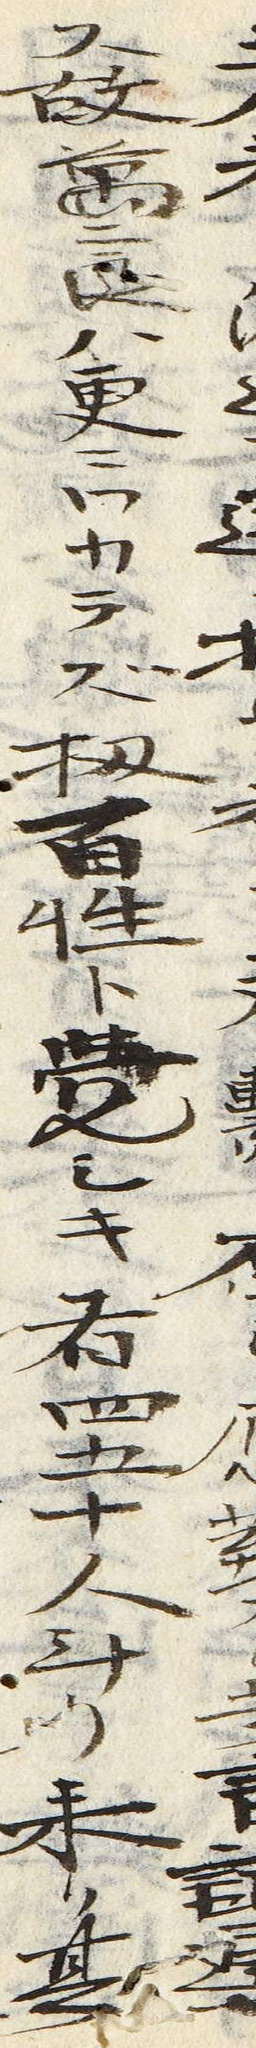ス故萬二郎ハ更ニワカラズ扨百姓ト覚シキ者四五十人計リ来リ其
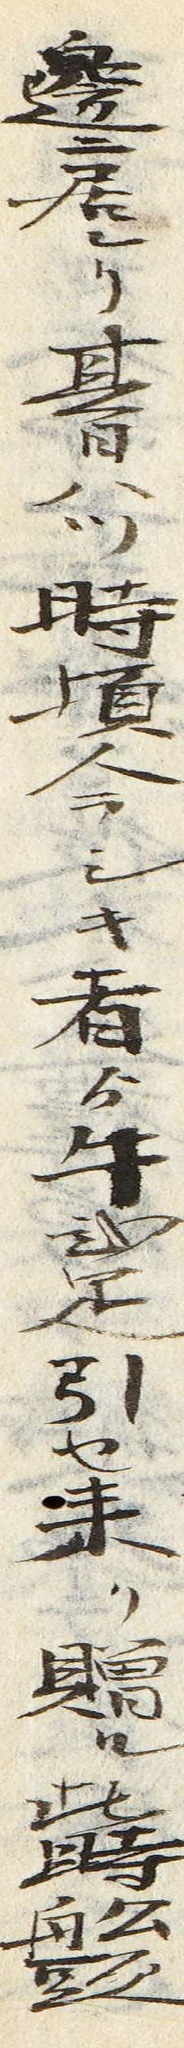辺ニ居レリ其日八ツ時頃人ラシキ者ゟ牛弐疋引セ来リ贈ル此時船頭

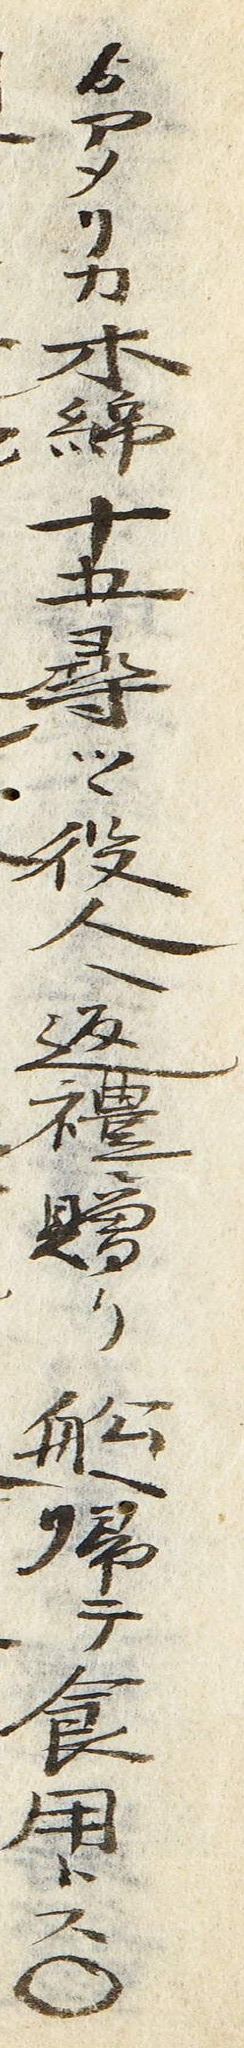ゟアメリカ木綿十五尋ツヽ役人ヘ返礼ニ贈リ船ヘ帰テ食用トス〇
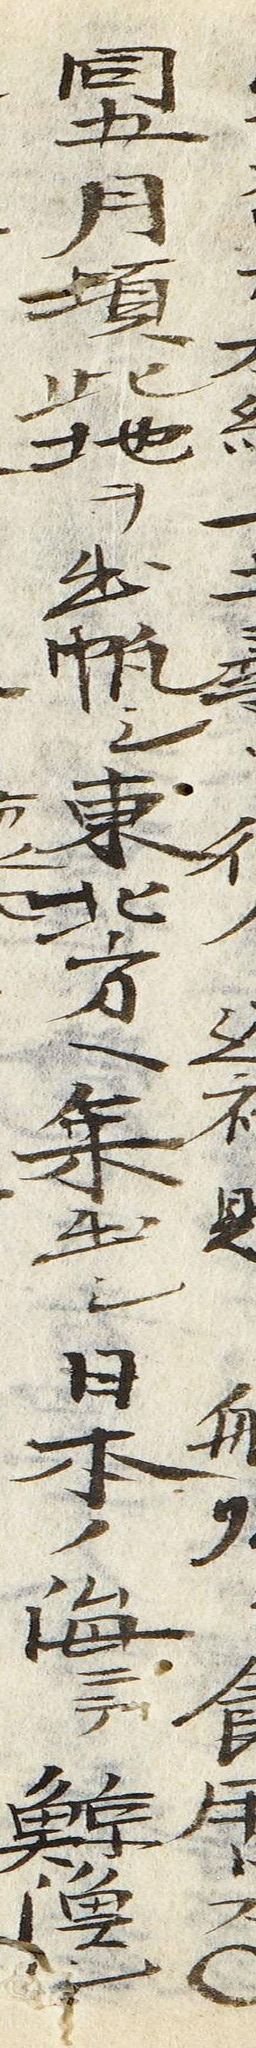同五月頃此地ヲ出帆シ東北方ヘ乗出シ二日本ノ海ニテ鯨漁シ
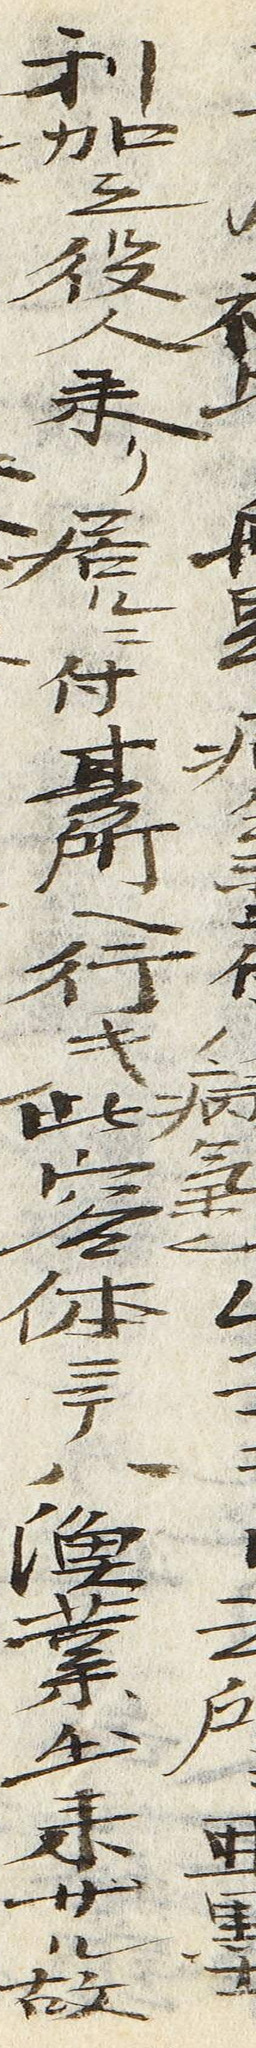利加之役人来リ居ルニ付其所へ行キ此容体ニテハ漁業出来ザル故
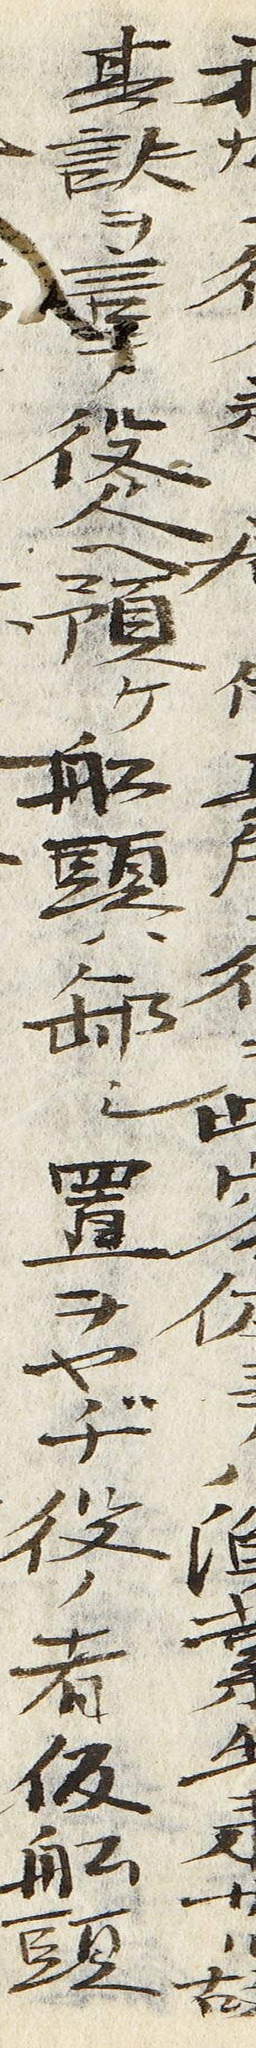其訳ヲ言テ役人ヘ預ケ船頭ハ卸シ置ヲヤヂ役ノ者仮船頭
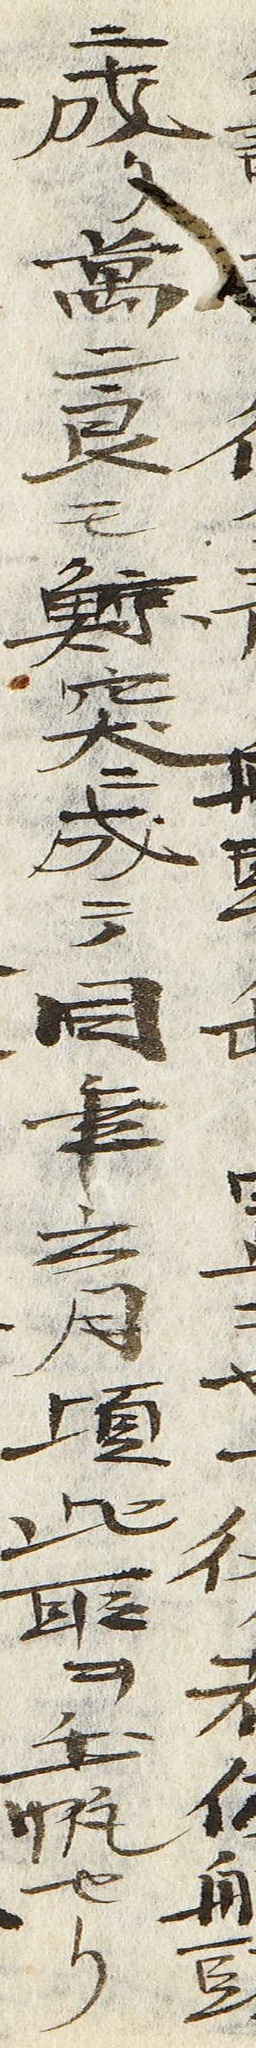ニ成リ萬二良モ鯨突ニ成テ同年六月頃此所ヲ出航セリ
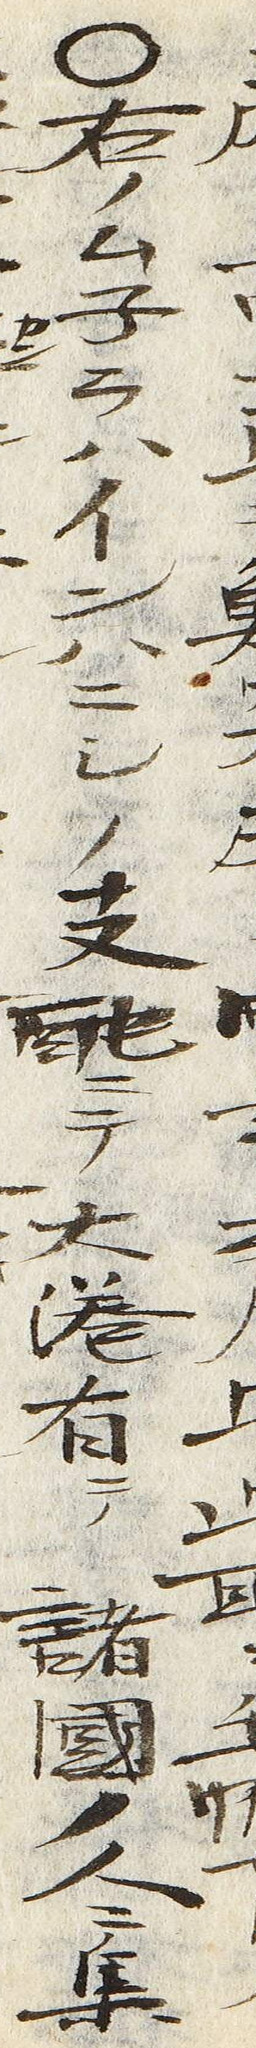〇右ノムネラハインハニシノ支配ニテ大港有テ諸国ノ人々集
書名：漂流記聞
